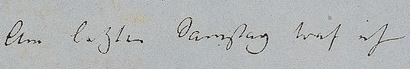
Am letzten Samstag traf ich
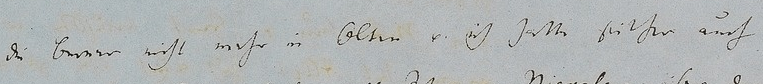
die Berner nicht mehr in Olten &. ich hatte seither auch
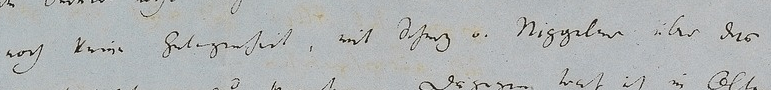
noch keine Gelegenheit, mit Scherz &. Niggeler über das
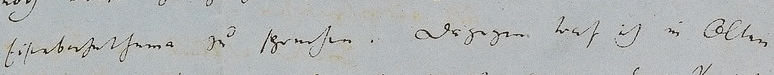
Eisenbahnthema zu sprechen. Dagegen traf ich in Olten
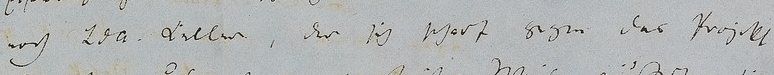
noch LdA. Keller, der sich scharf gegen das Projekt
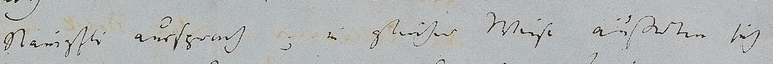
Stämpfli aussprach; in gleicher Weise äußerten sich
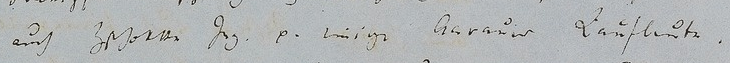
auch Zschokke Ing. &. einige Aarauer Kaufleute.
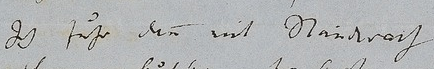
Ich fuhr dann mit Ständerath
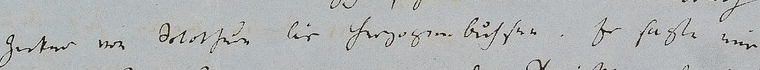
Jecker von Solothurn bis Herzogenbuchsee. Er sagte mir,
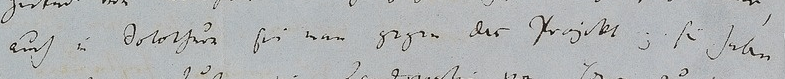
auch in Solothurn sei man gegen das Projekt; sie haben
